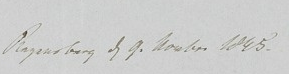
Regensberg den 9. Novbr 1845.
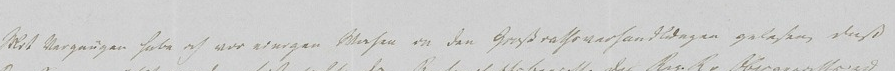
Mit Vergnügen habe ich vor einigen Wochen in den Großrathsverhandlungen gelesen, daß
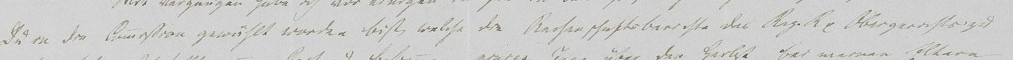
Du in die Commission gewählt worden bist, welche die Rechenschaftsberichte des Reg.R & Obergerichts zu
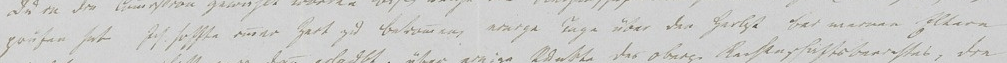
prüfen hat. Ich hoffte immer Zeit zu bekommen, einige Tage über den Herbst bei meinen Eltern
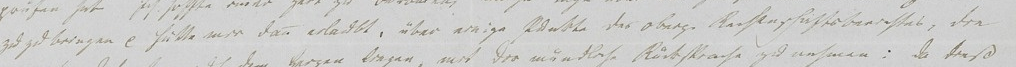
zuzubringen & hätte mir dann erlaubt, über einige Punkte des oberg. Rechenschaftsberichtes, die
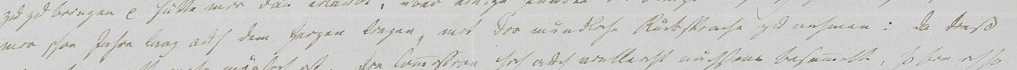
mir schon Jahre lang auf dem Herzen liegen, mit Dir mündliche Rücksprache zu nehmen: da dieß
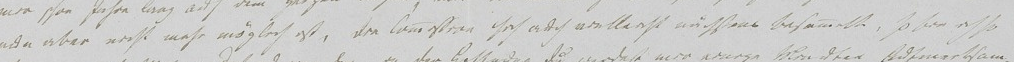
nun aber nicht mehr möglich ist, die Commission sich auch vielleicht nächstens besammelt, so bin ich so
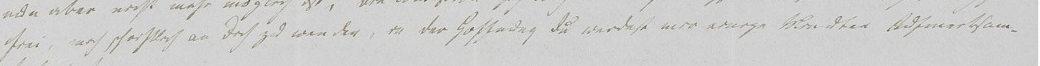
frei, mich schriftlich an Dich zu wenden, in der Hoffnung Du werdest mir einige Minuten Aufmerksam-
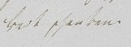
keit schenken.
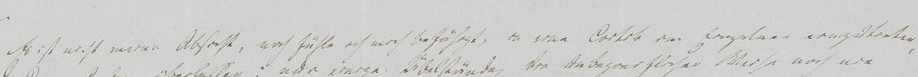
Es ist nicht meine Absicht, noch fühle ich mich befähigt, in eine Critik im Einzelnen einzutreten,
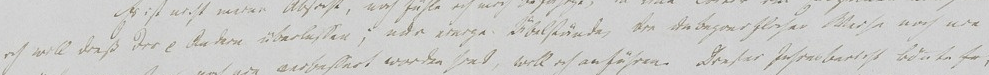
ich will dieß Dir & Andern überlassen; nur einige Übelstände, die unbegreiflicher Weise noch nie
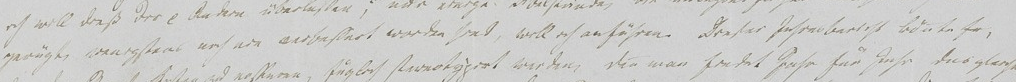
gerügt, wenigstens noch nie verbessert worden sind, will ich anführen. Dieser Jahresbericht könnte so,
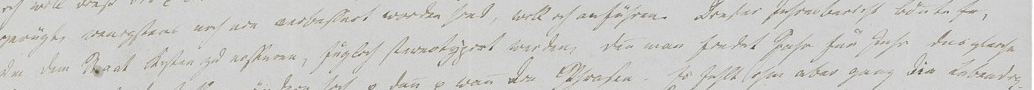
um dem Staat Kosten zu ersparen, füglich stereotypirt werden, denn man findet Jahr für Jahr das gleiche
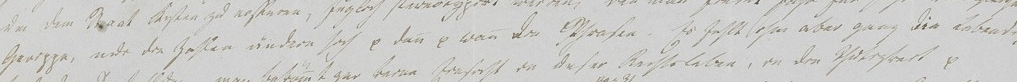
Gerippe, nur die Zahlen ändern sich & dann & wann die Phrasen. Es fehlt ihm aber ganz die Lebendig-
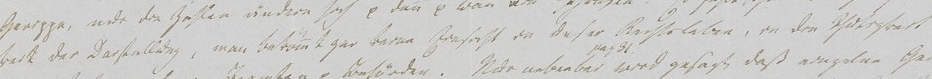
keit der Darstellung, man bekömmt gar keine Einsicht in unser Rechtsleben, in die Thätigkeit &
